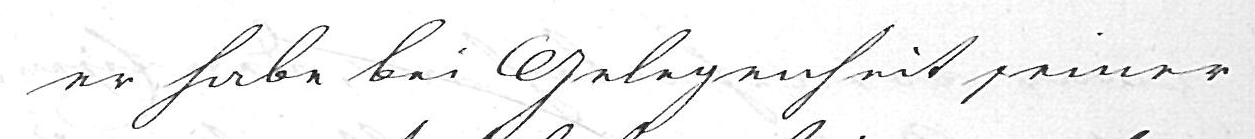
er habe bei Gelegenheit seiner
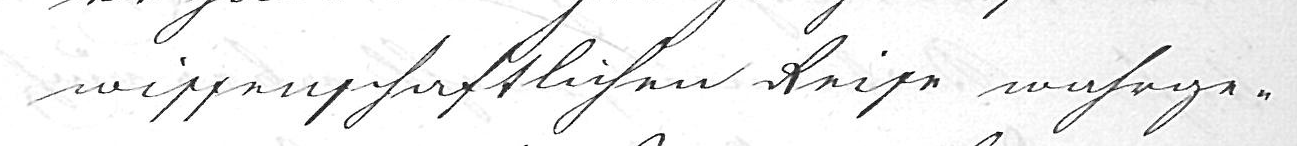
wissenschaftlichen Reise wahrge-
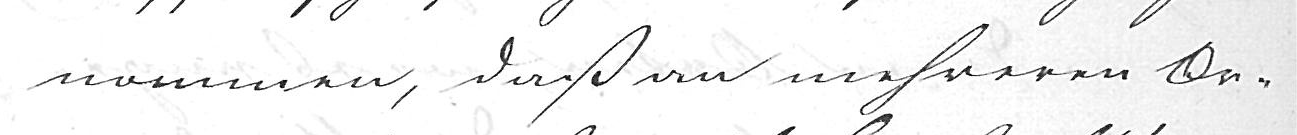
nommen, daß an mehreren Or-
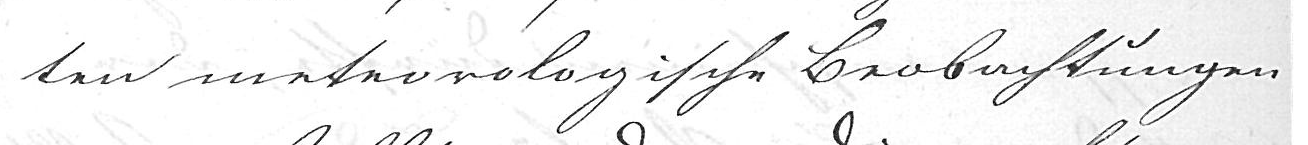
ten meteorologische Beobachtungen
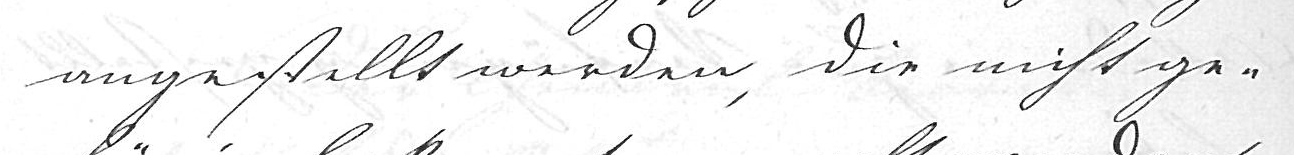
angestellt werden, die nicht ge-
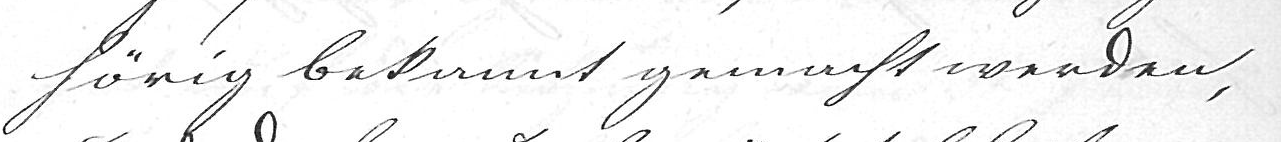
hörig bekannt gemacht werden,
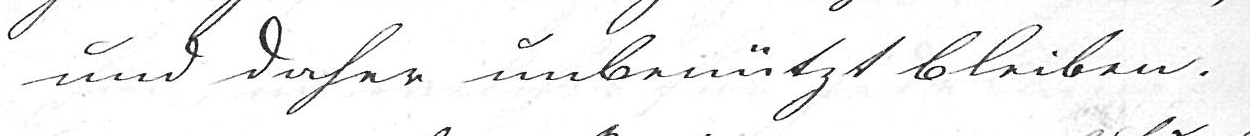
und daher umbenützt bleiben.
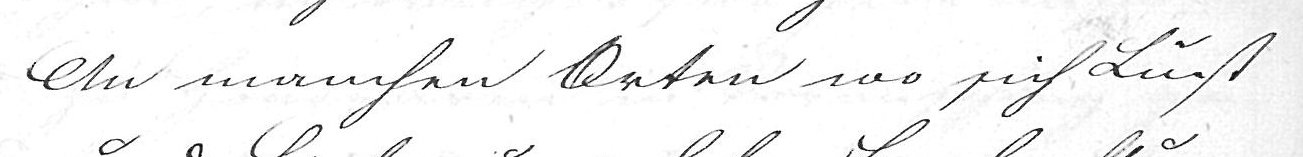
An machen Orten wo sich Lust
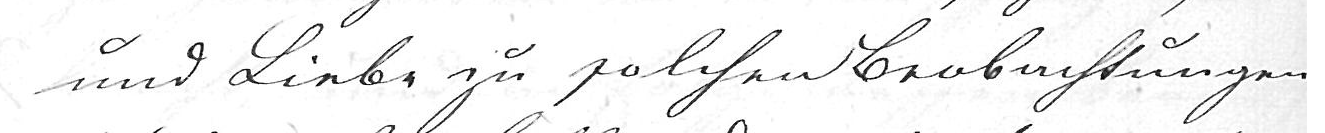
und Liebe zu solchen Beobachtungen
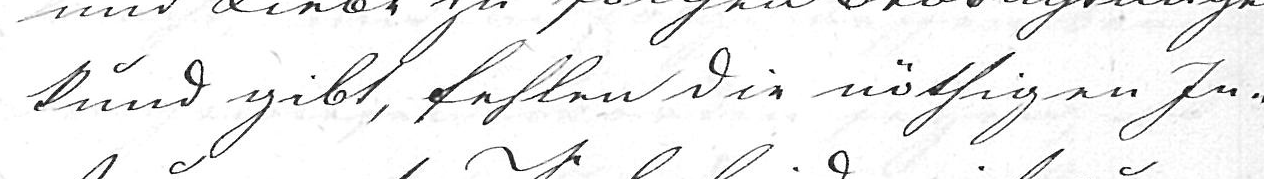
kund gibt, fehlen die nöthigen In-
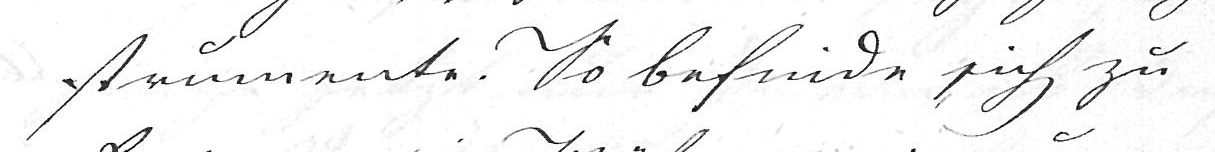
strumente. So befinde sich zu
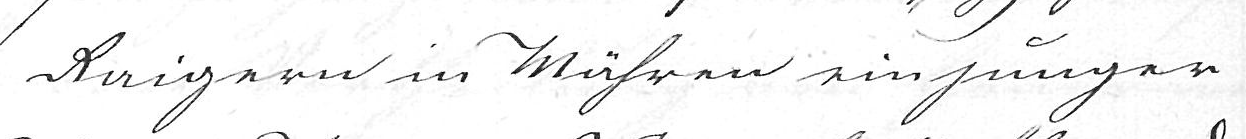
Raigern in Mähren ein junger
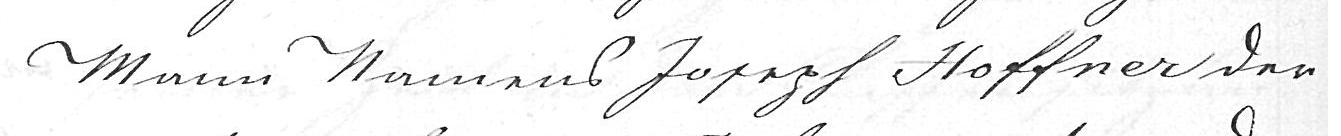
Mann Namens Joseph Hoffner der
